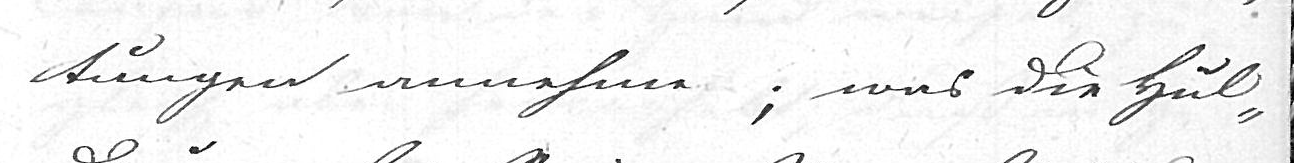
tungen annehme; was die Hul-
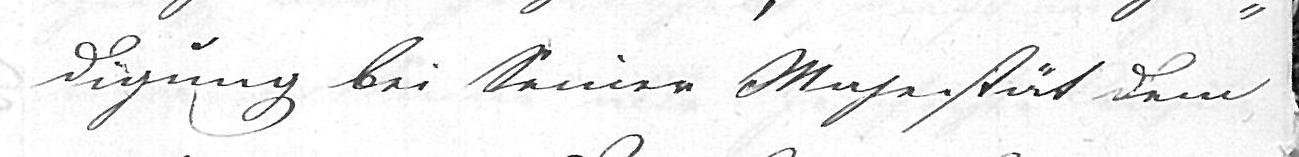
digung bei Seiner Majestät dem
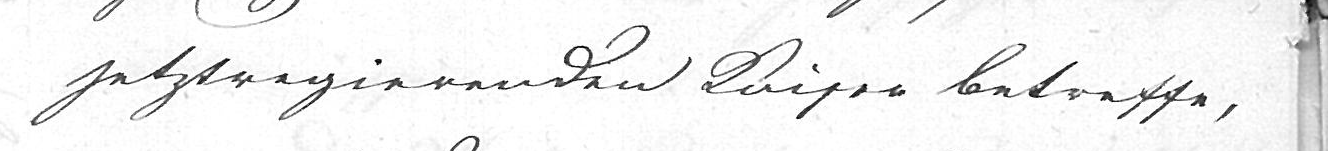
jetztregierenden Kaiser betreffe,
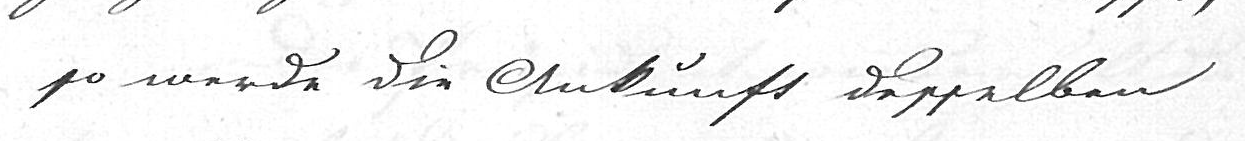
so werde die Ankunft desselben
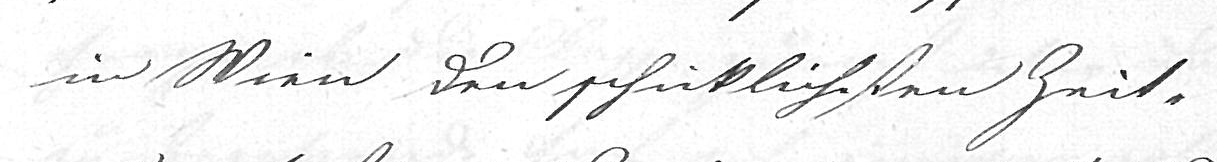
in Wien den schicklichsten Zeit-
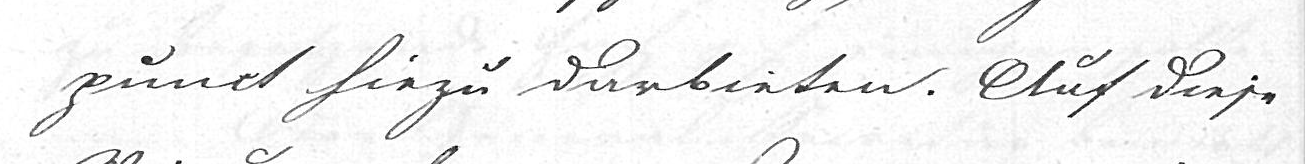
punct hiezu darbieten. Auf diese
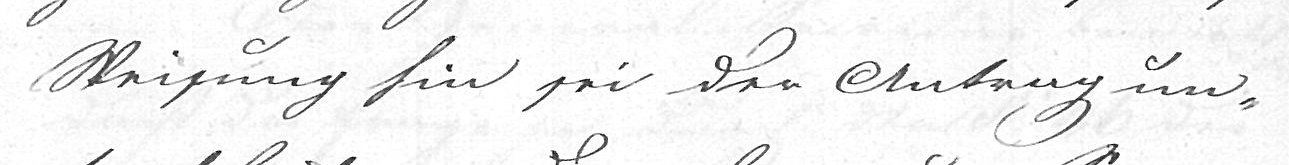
Weisung hin sei der Antrag un-
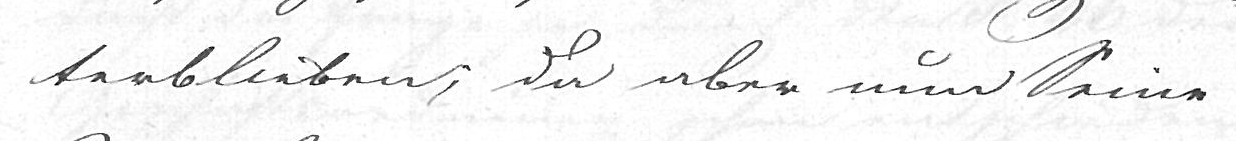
terblieben, da aber nun Seine
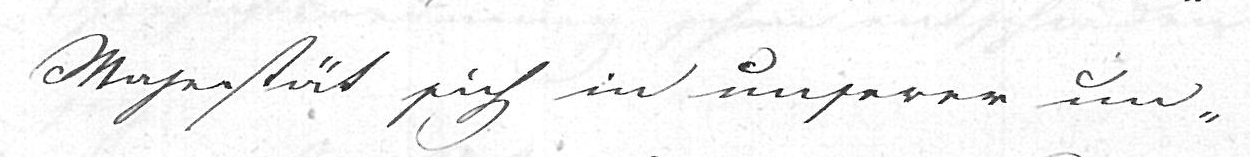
Majestät sich in unserer un-
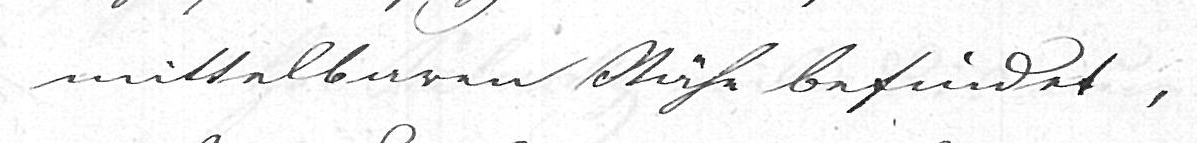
mittelbaren Nähe befindet,
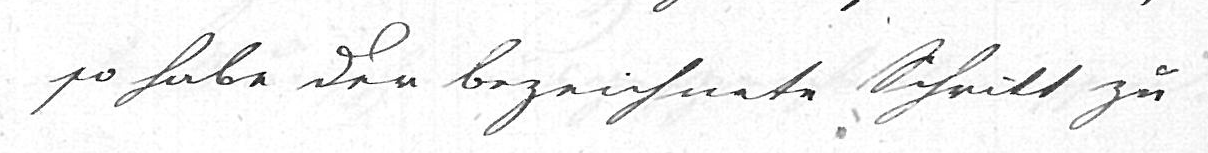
so habe der bezeichnete Schritt zu
